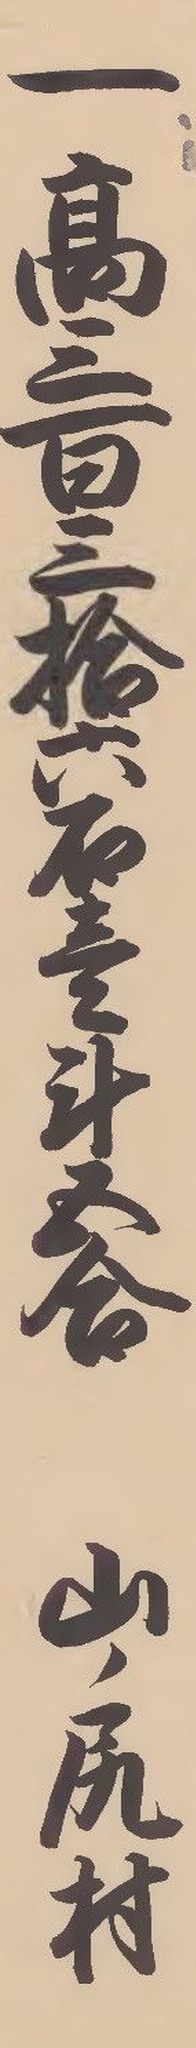一高三百三拾六石壱斗五合山ノ尻村
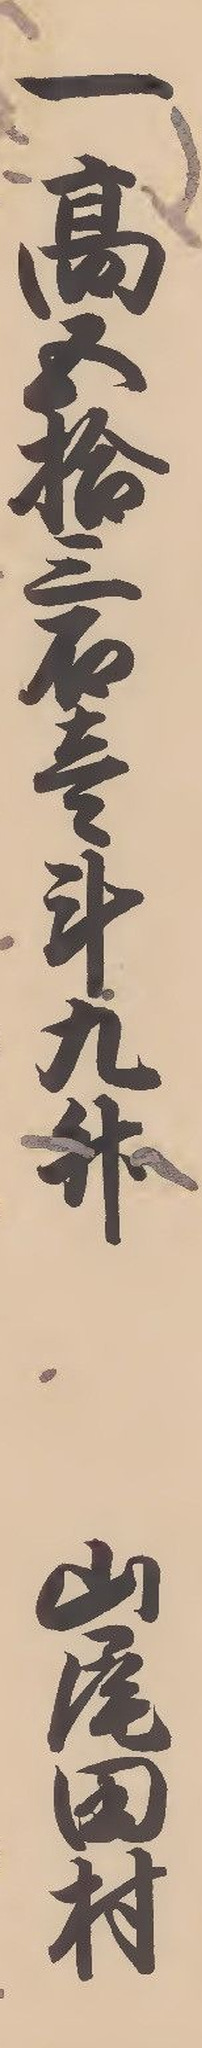一高五拾三石壱斗九升山尾田村

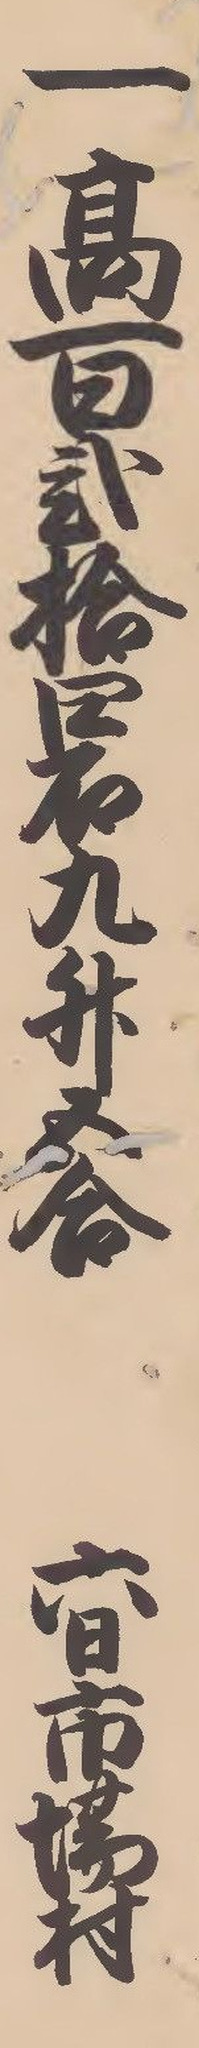一高百弐拾四石九升五合六日市場村
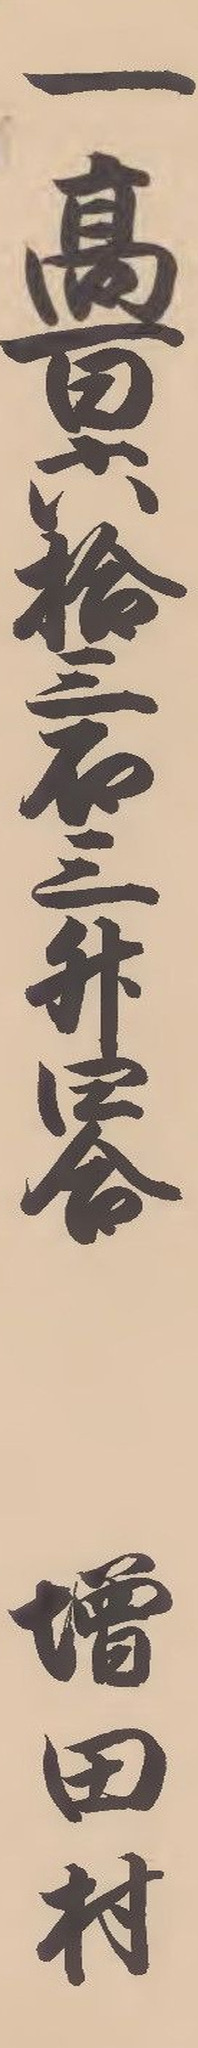一高百六拾三石三升四合増田村
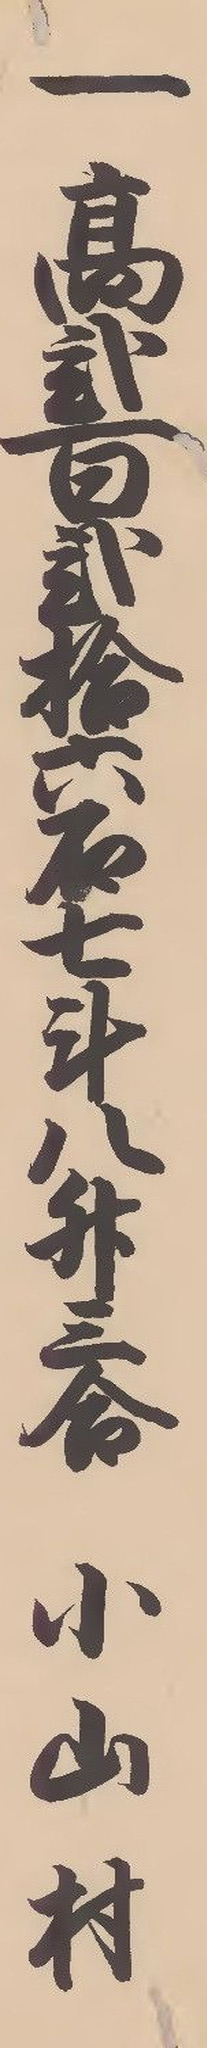一高弐百弐拾六石七斗八升三合小山村
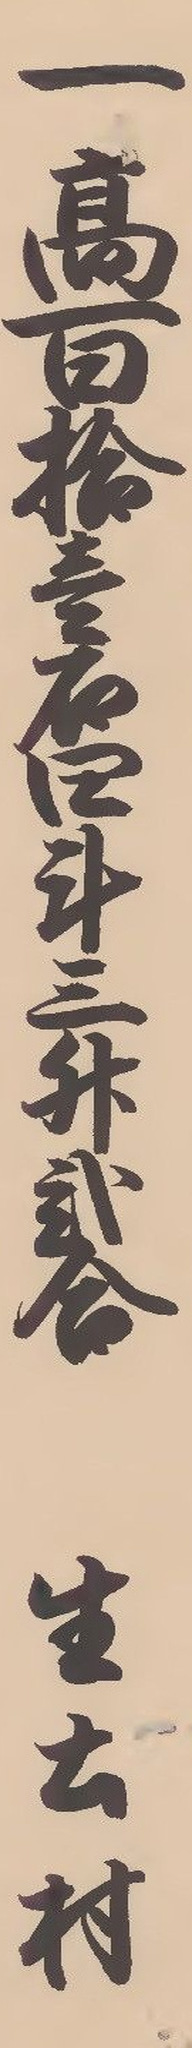一高百拾壱石四斗三升弐合生土村
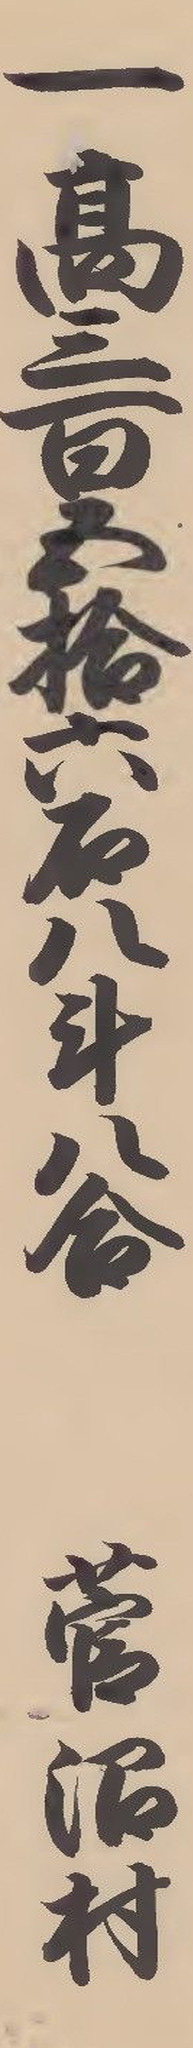一高三百五拾六石八斗八合菅沼村
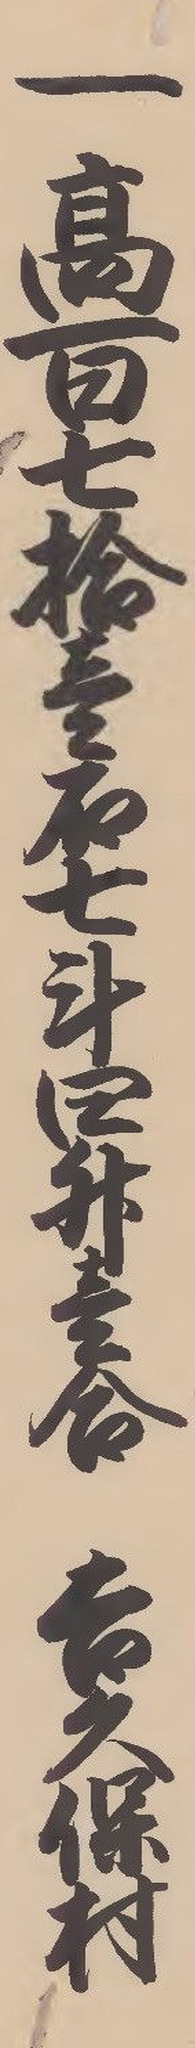一高百七拾壱石七斗四升壱合吉久保村
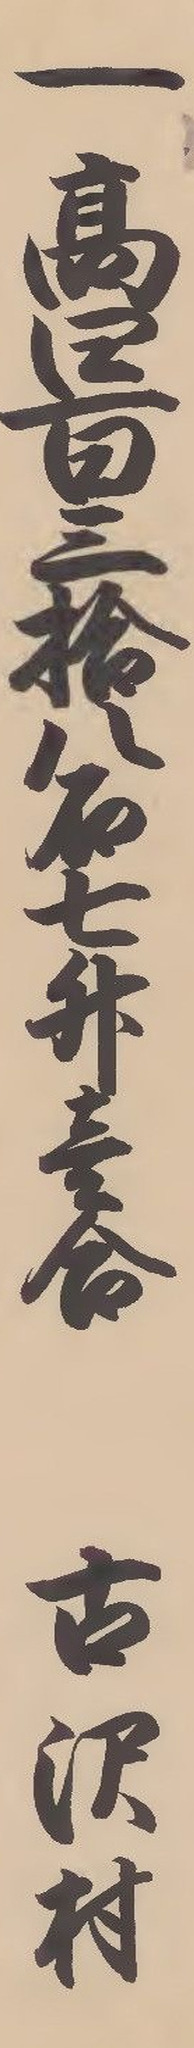一高四百三拾八石七升壱合古沢村
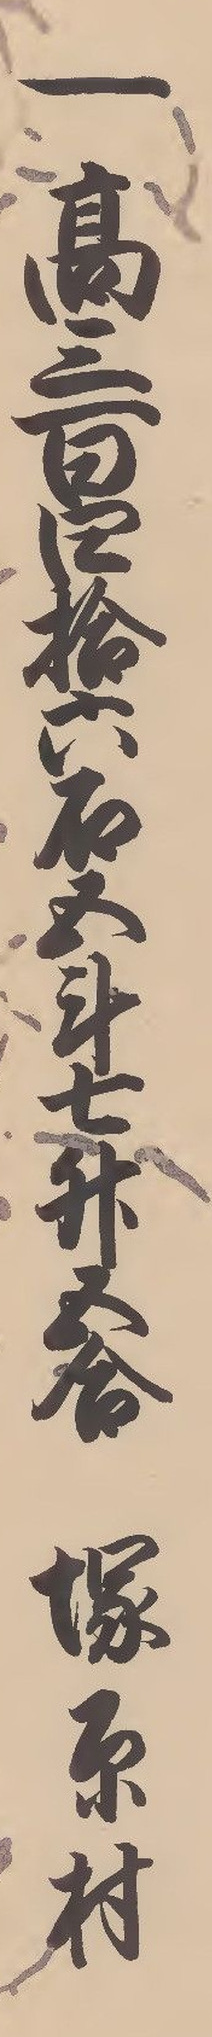一高三百四拾六石五斗七升五合塚原村

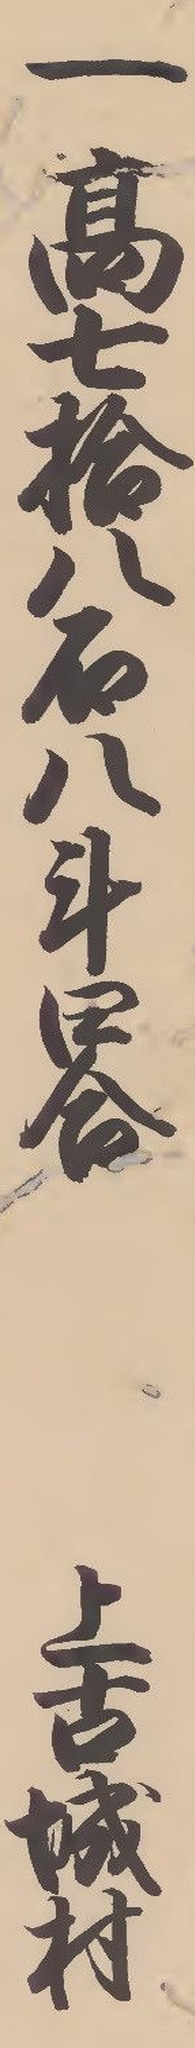一高七拾八石八斗四合上古城村
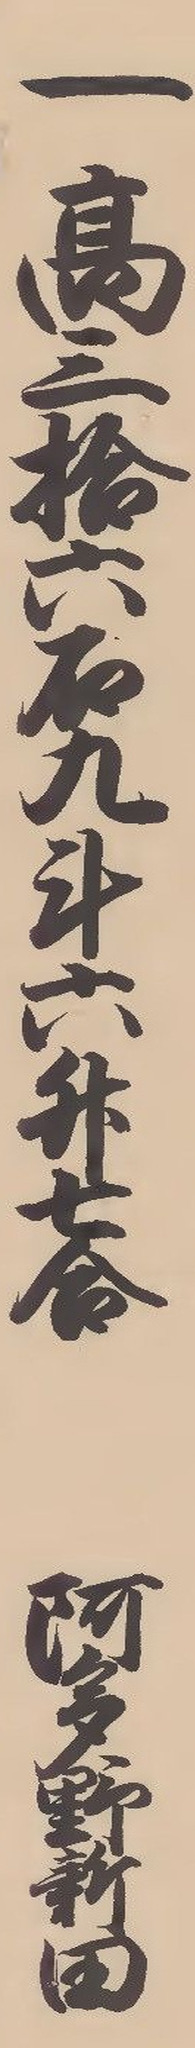一高三拾六石九斗六升七合阿多野新田
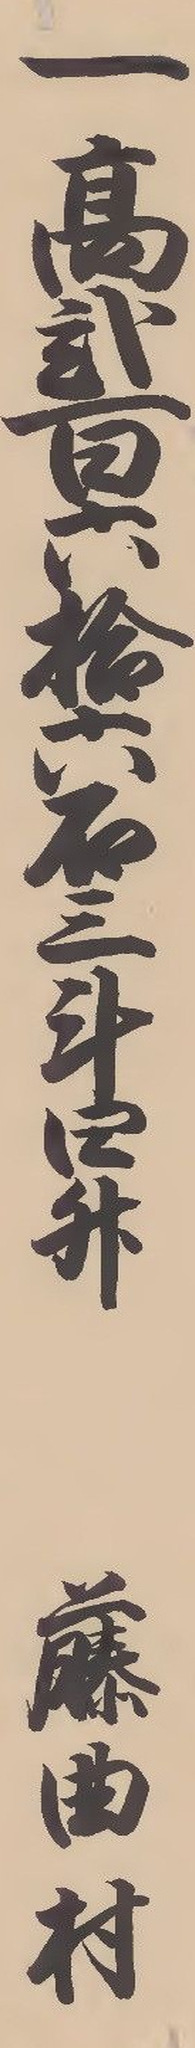一高弐百六拾六石三斗四升藤曲村
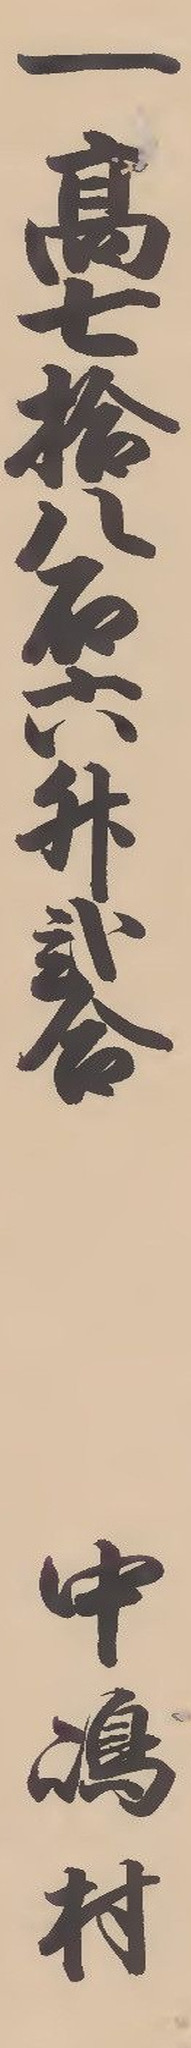一高七拾八石六升弐合中島村
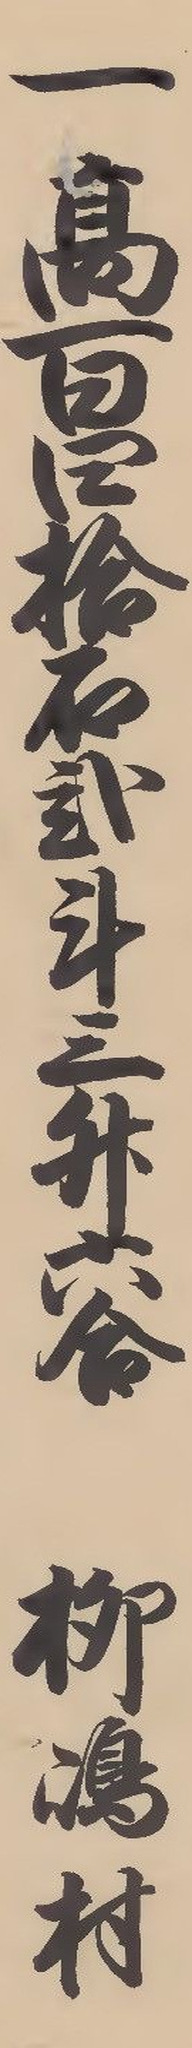一高百四拾石弐斗三升六合柳島村
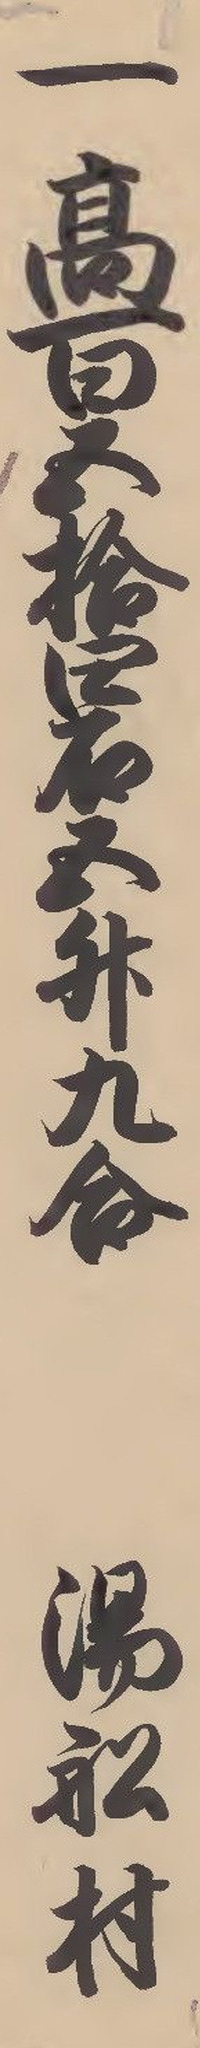一高百五拾四石五升九合湯船村
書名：駿河国郷帳
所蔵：国立公文書館 National Archives of Japan
